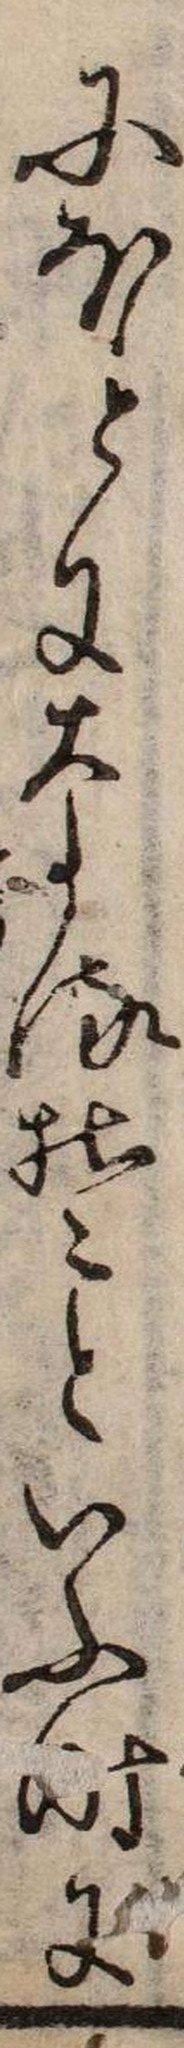にほとになるぞといふ時に
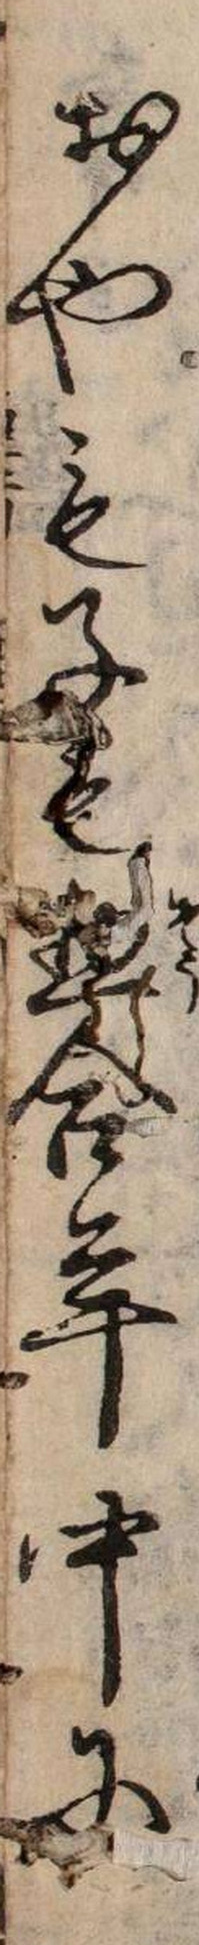おやも子も相合年中に

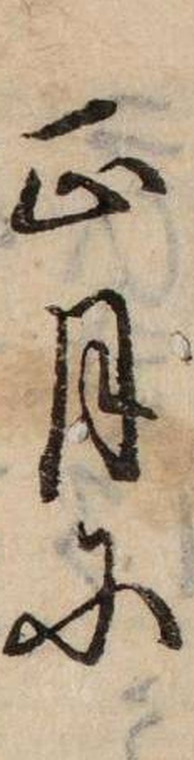正月に
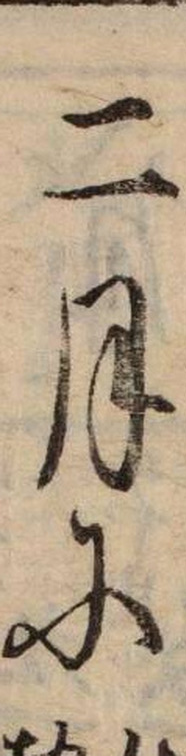正月に
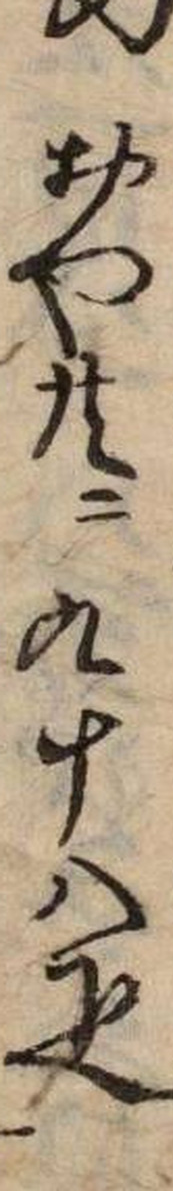おや共に九十八疋

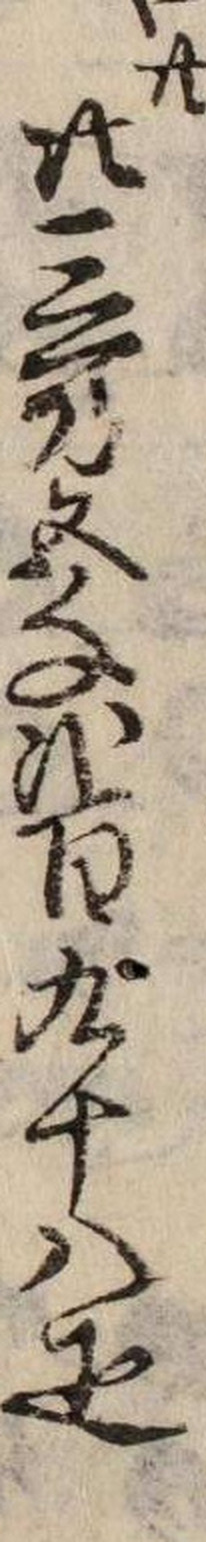おや共廿三万五千弐百九十八疋
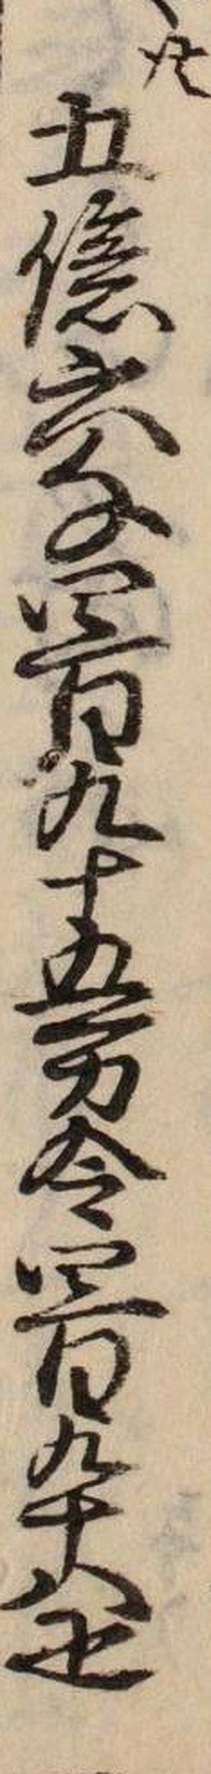おや共五億六千四百九十五万令四百九十八疋
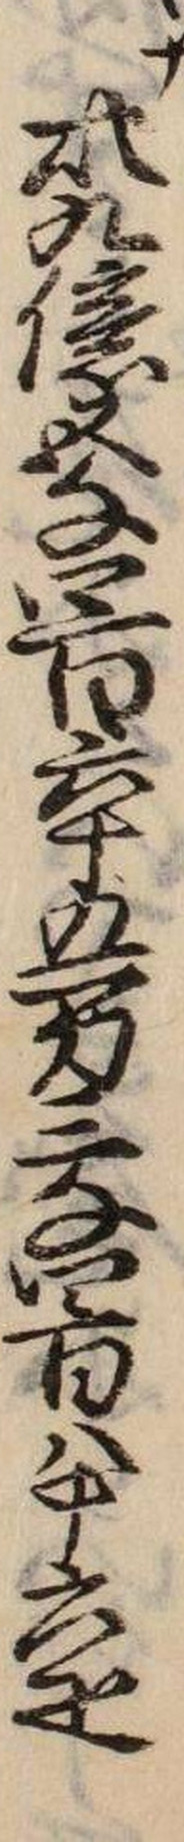おや共卅九億五千四百六十五万三千四百八十六疋
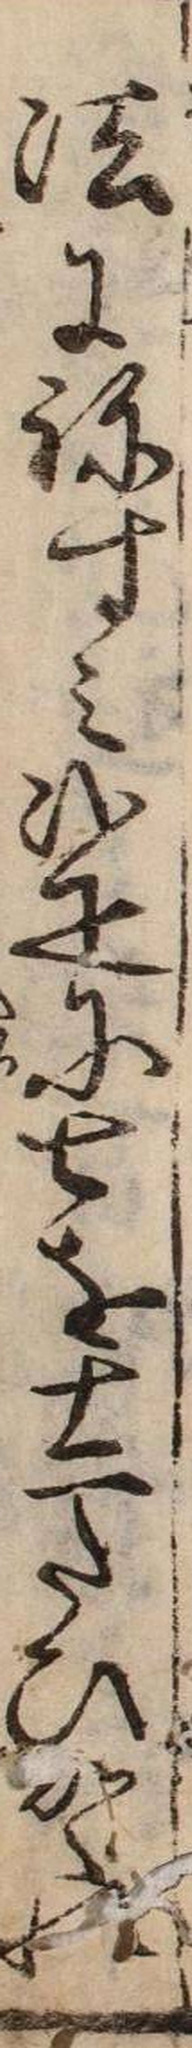法にねすみ弐疋に七を十二たひかくれ
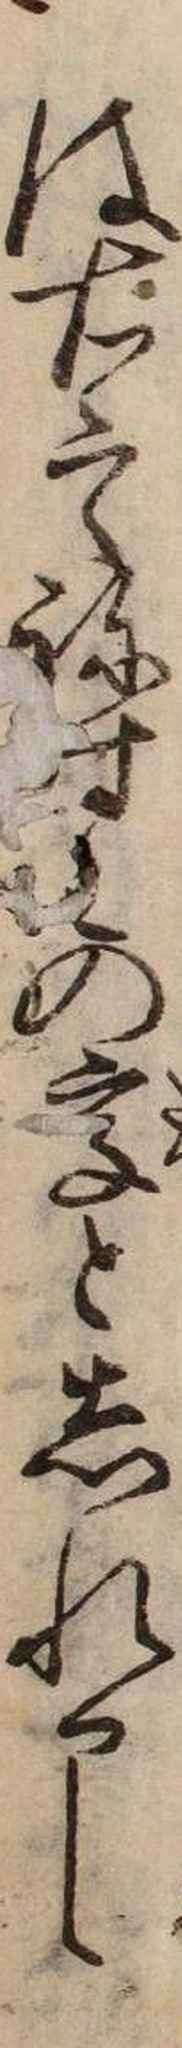は右之なすみの高としれ申候

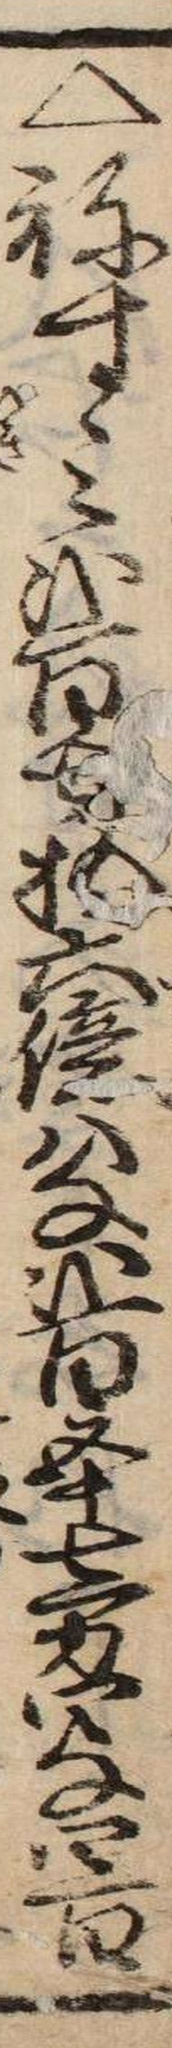△ねすゝみ弐百七拾六億八千弐百五十七万四千四百
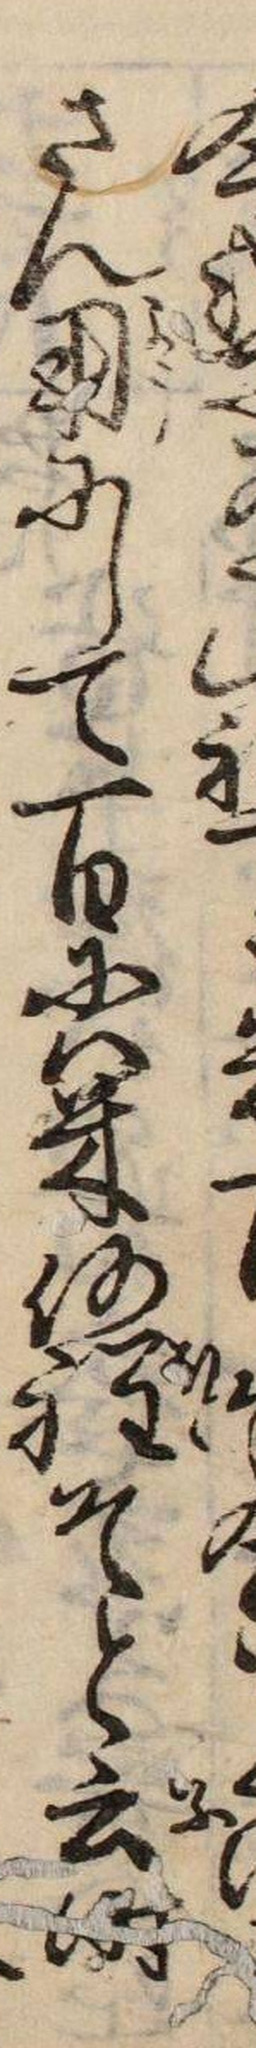さん用にして百には米何程そと云時
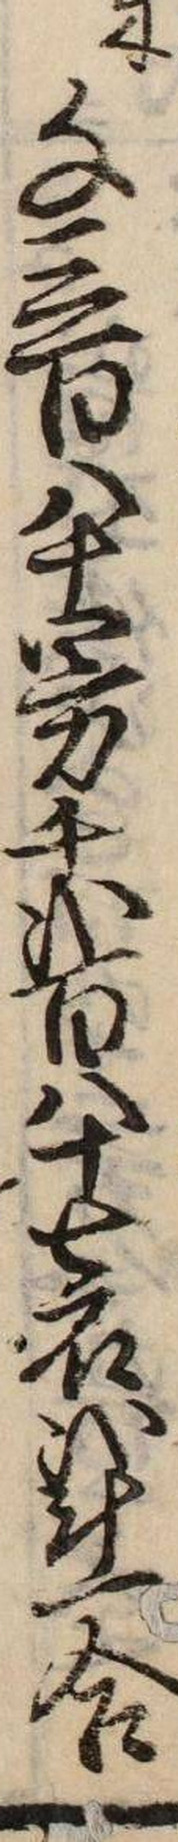米千三百八十四万千弐百八十七石弐斗一合
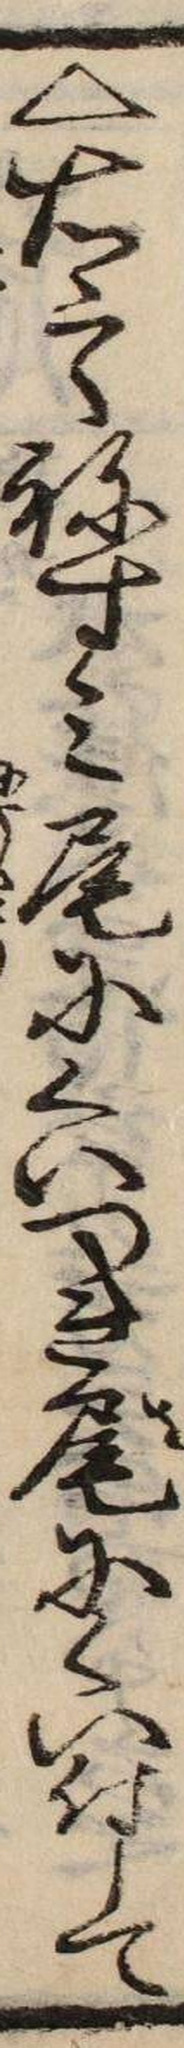△右之ねすみ尾にくいつき尾にくい付して
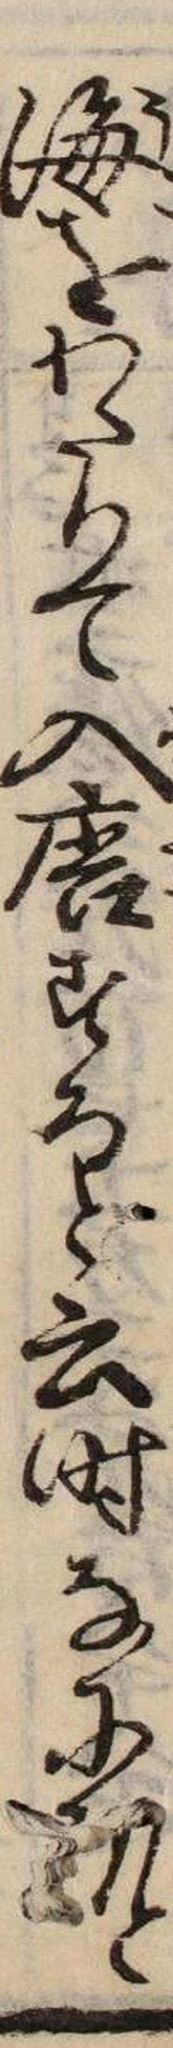海をわたりて入唐すると云時なにほと
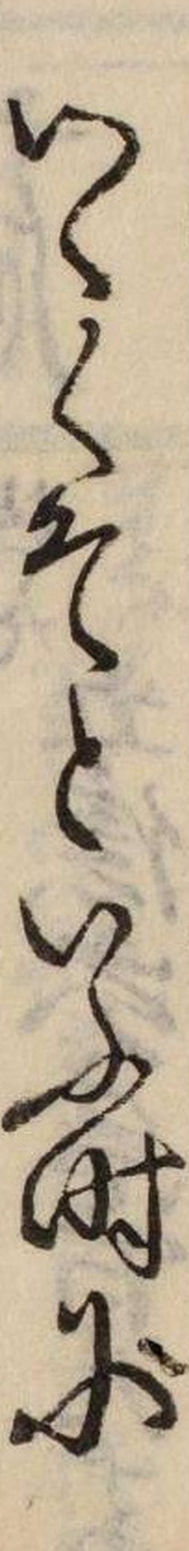いいくそといふ時に
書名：塵劫記（寛永11年自跋、京都府立京都学・歴彩館追貴8）
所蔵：京都府立京都学・歴彩館 国文学研究資料館
